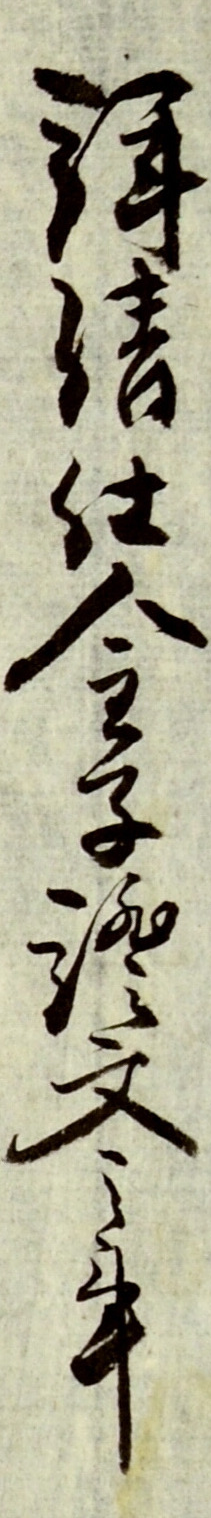拝借仕金子証文之事
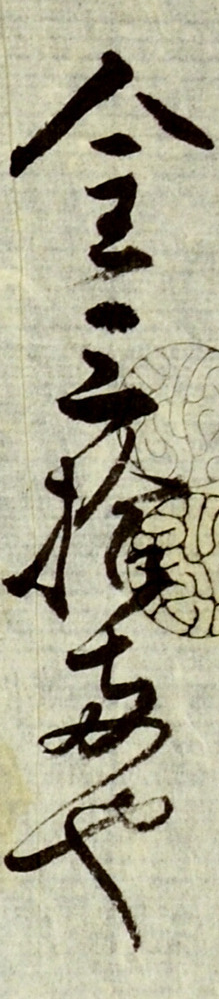金三拾両也
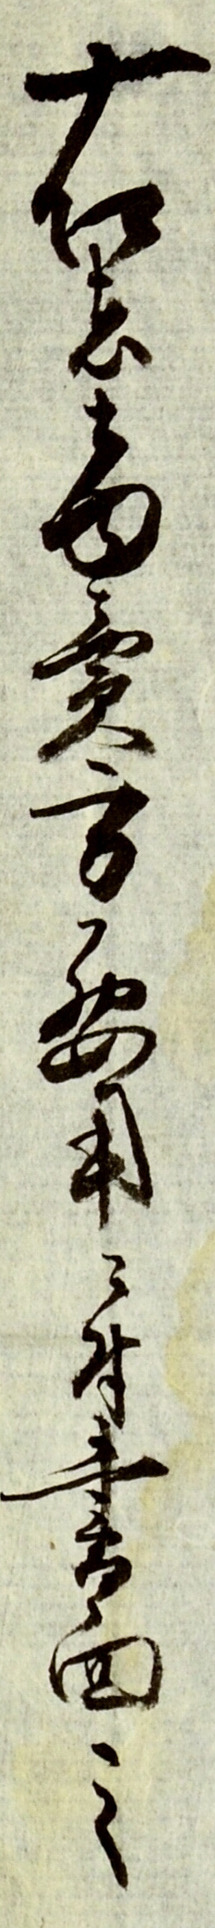右者商売要用ニ付書面之
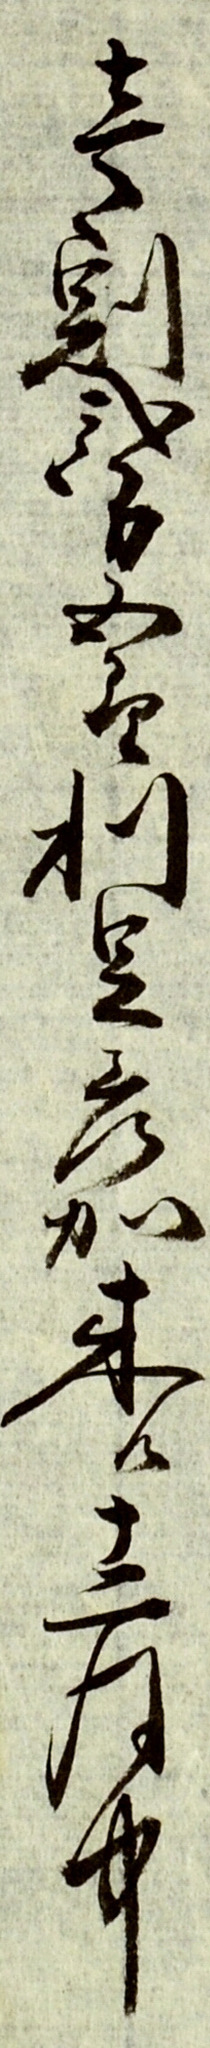壱割弐分五厘利足差加来ル十二月中
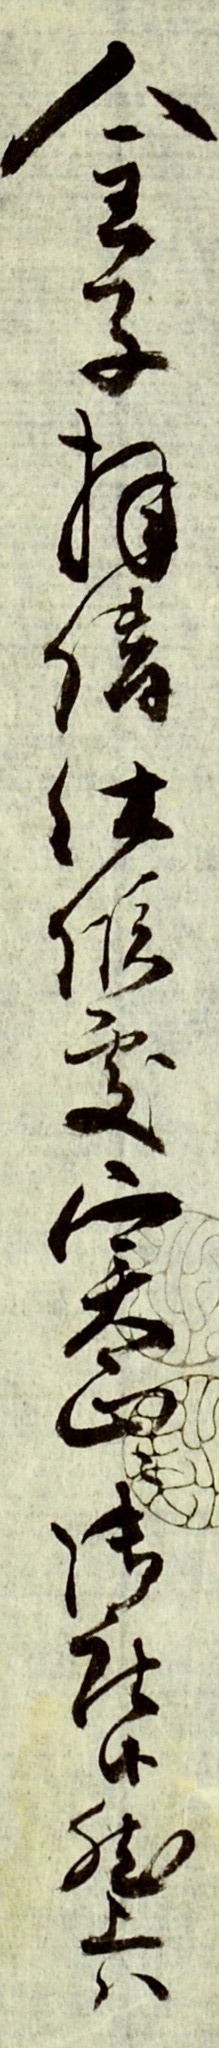金子拝借仕候処実正ニ御座候然上ハ
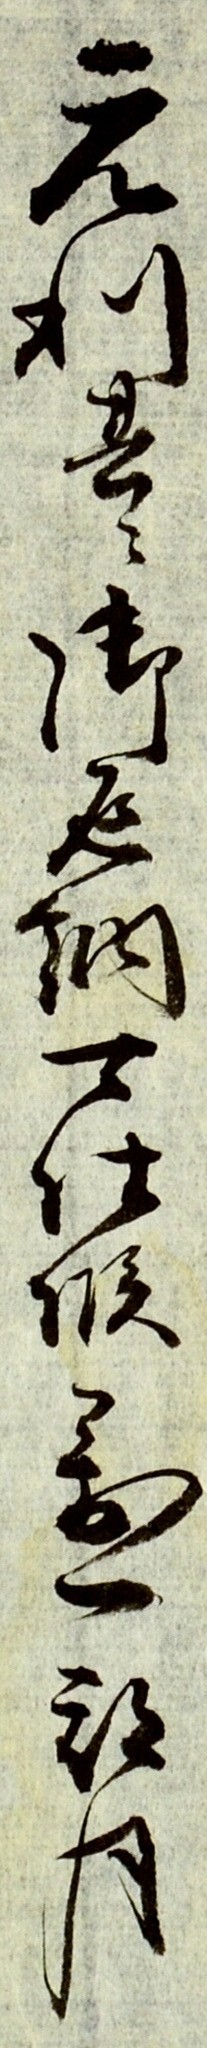元利共ニ御返納可仕候万一斯月
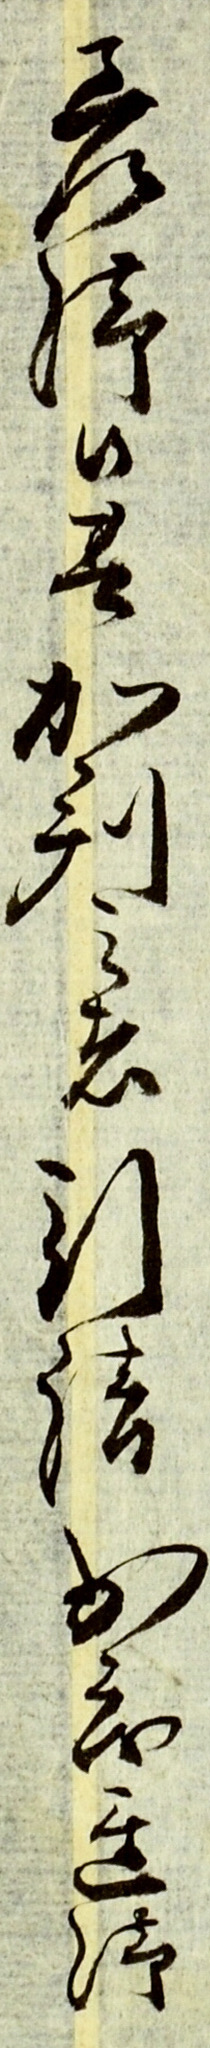差滞候共加判之者引請少茂遅滞
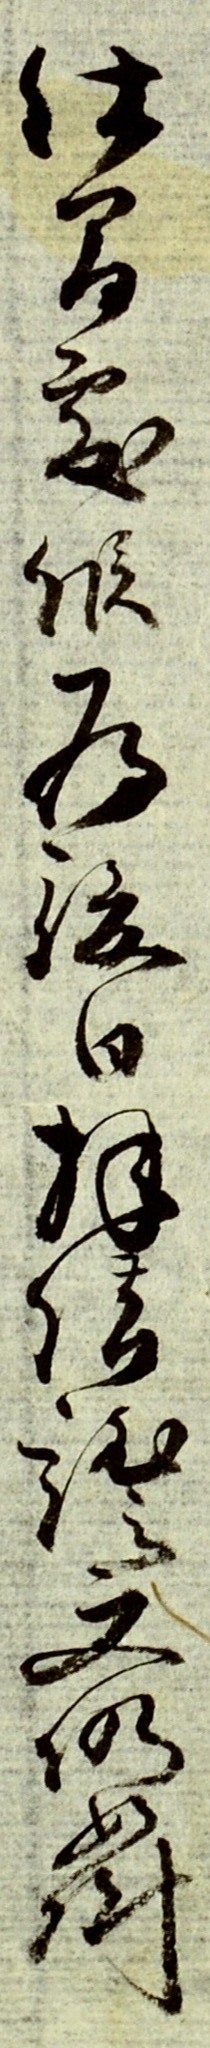仕間敷候為後日拝借証文仍如件
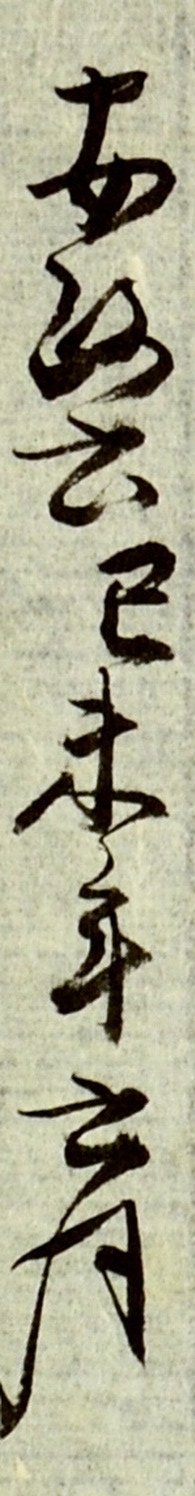安政六己未年六月
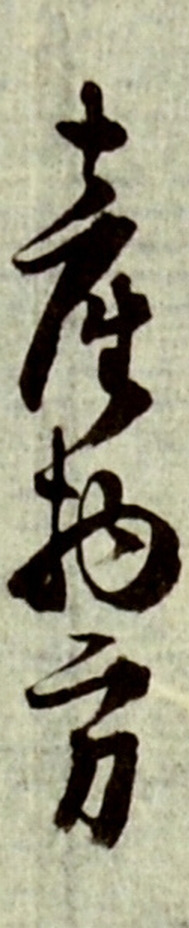産物方
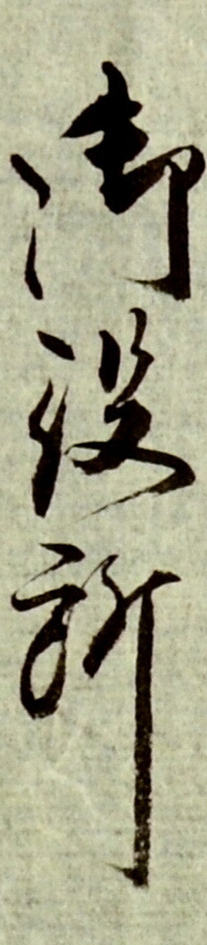御役所
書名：拝借仕金子證文之事
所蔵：伊那市立高遠町図書館・合同会社AMANE
